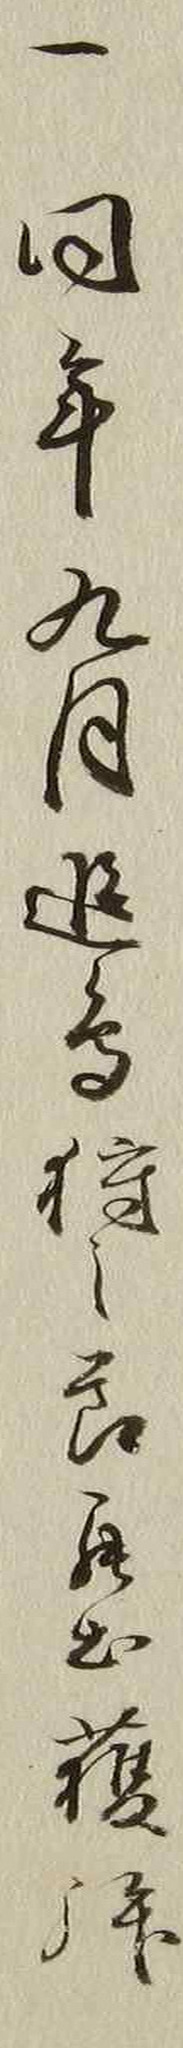一同年九月追鳥狩之節罷出獲拝
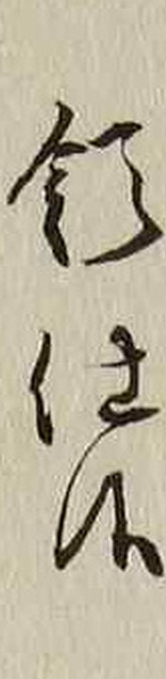領仕候
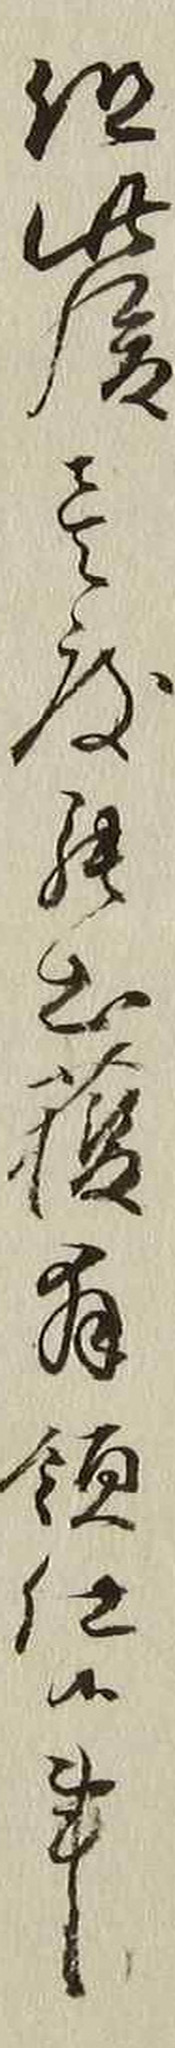但此後壱度罷出獲拝領仕候事
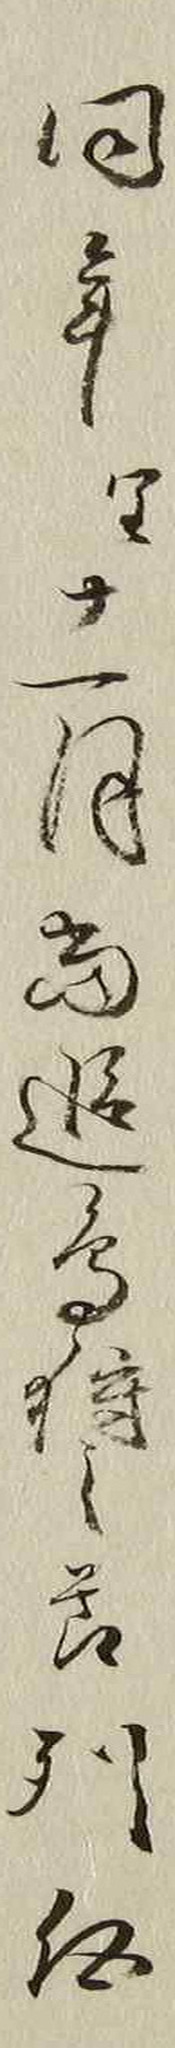一同年閏十一月当追鳥狩之節列伍
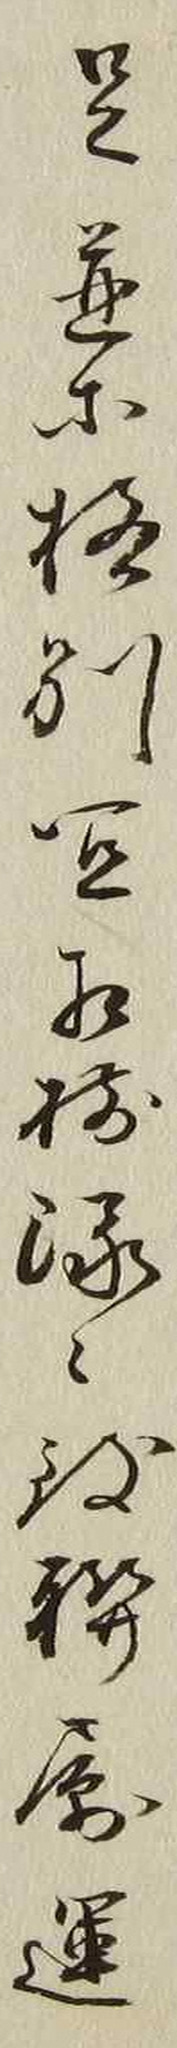足並等格別宜相揃隊々致聯属運
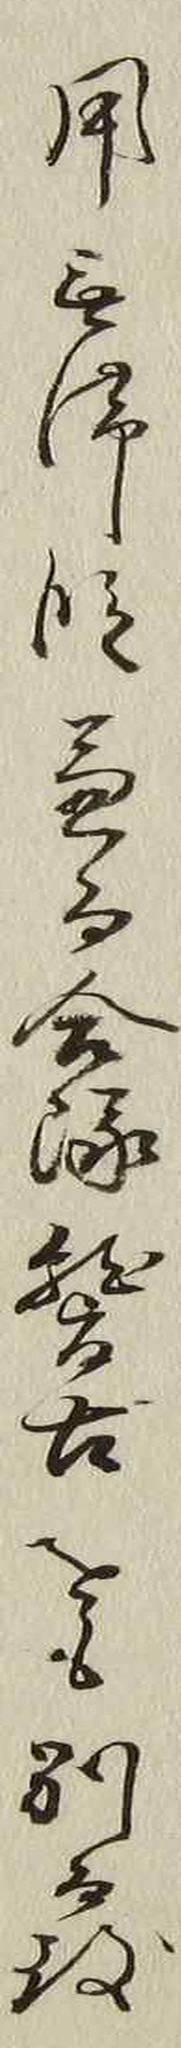用無滞段兼而合隊稽古をも別而致
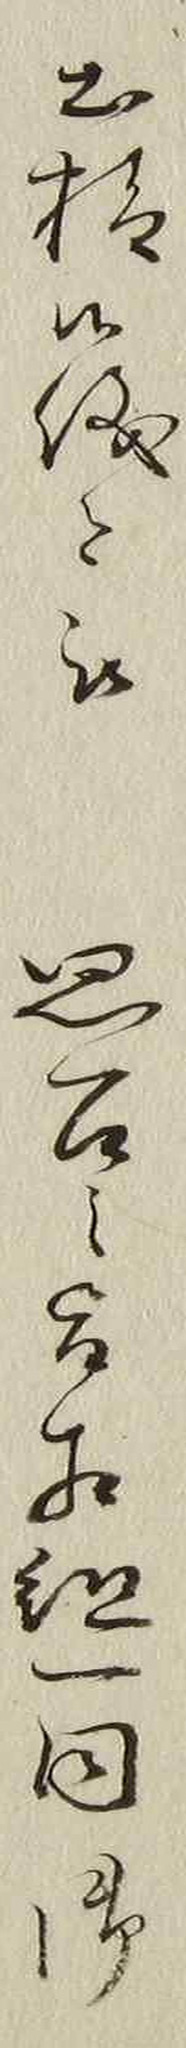出精候儀と被思召之旨相組一同御
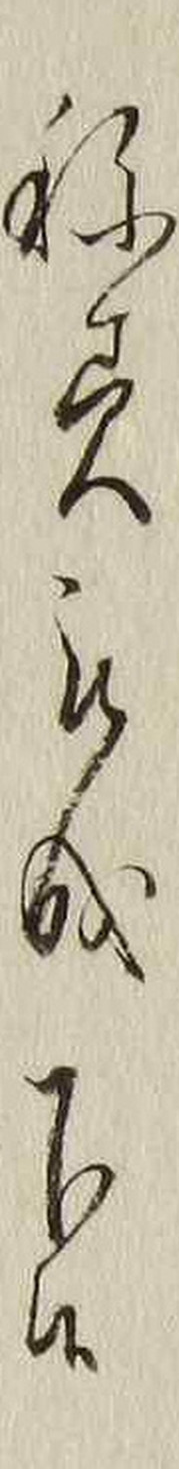称美被成下候
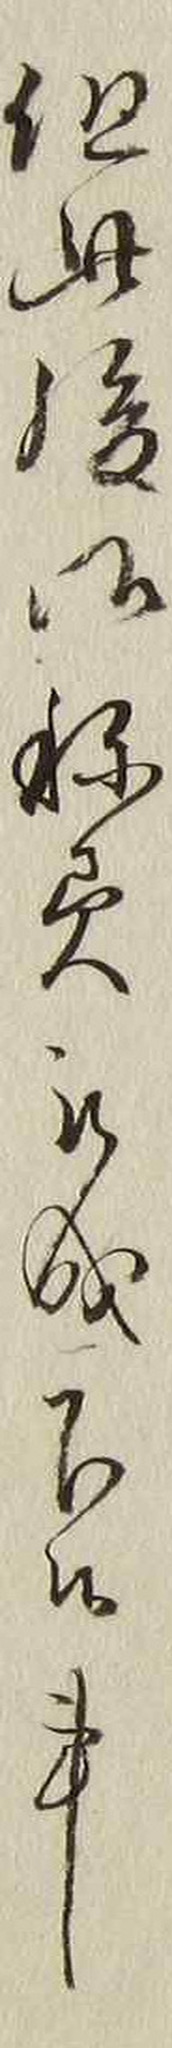但此後御称美被成下候事
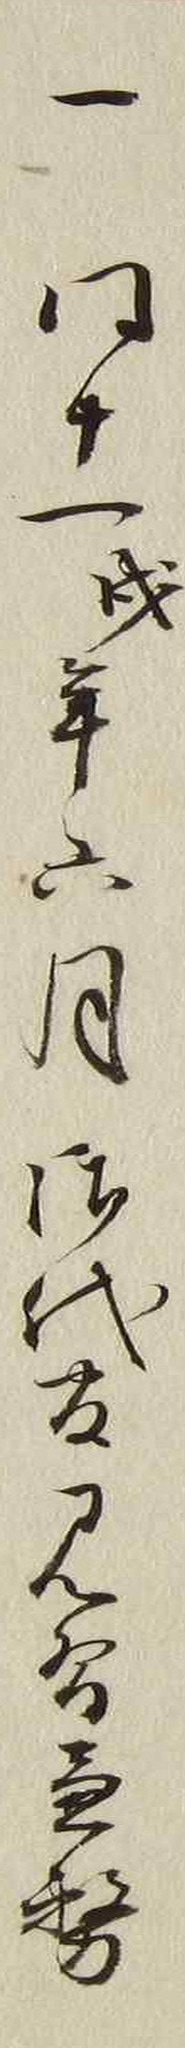一同十一戌年六月御代官見習兼務
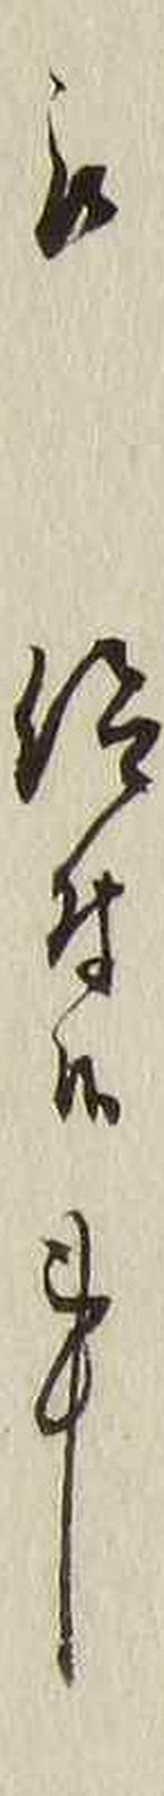被仰付候事
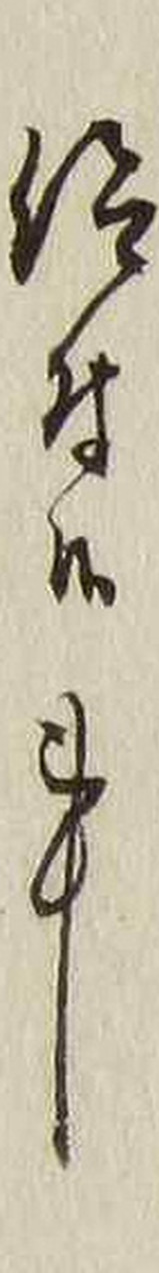仰付候事
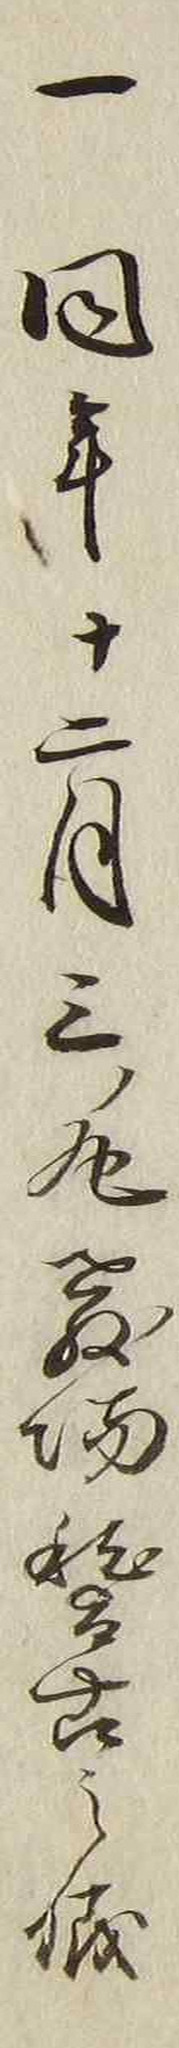一同年十二月三ノ丸教場稽古之儀

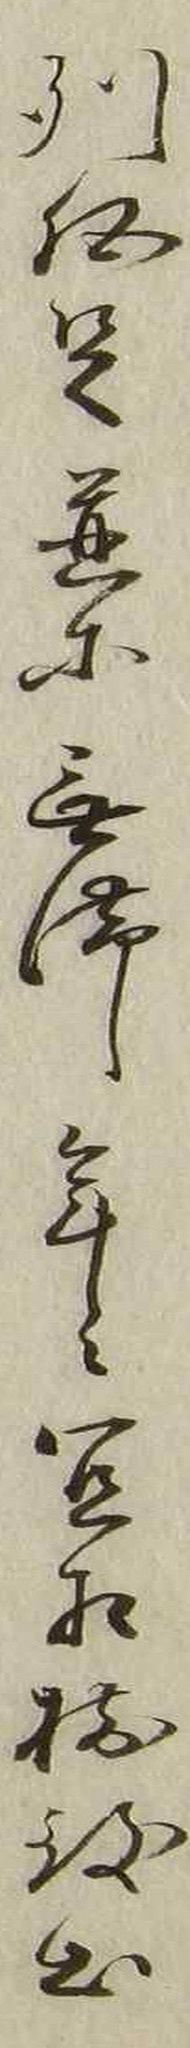列伍足並等無滞年々宜相揃致出
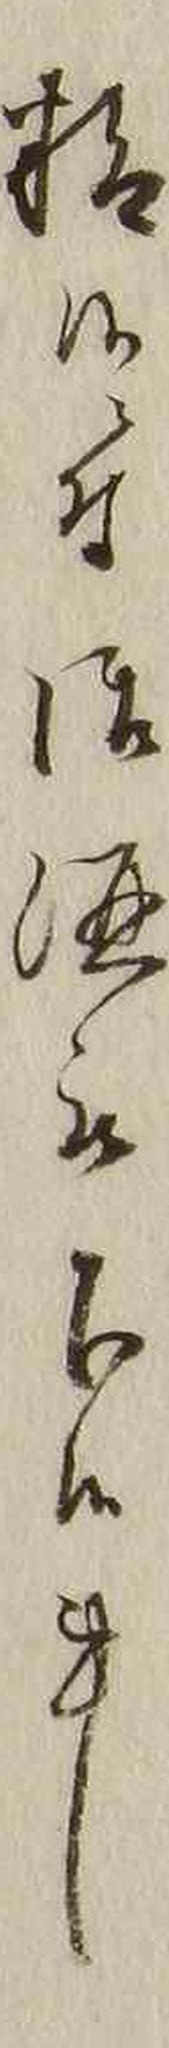精候ニ付御酒被下候事
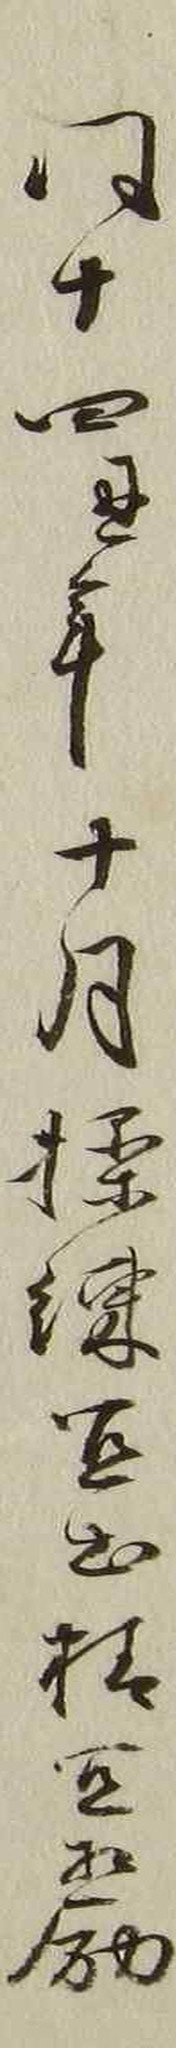一同十四丑年十月操練宜出精宜相励
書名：諸士系譜　巻之26　い之部26
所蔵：会津若松市立会津図書館
